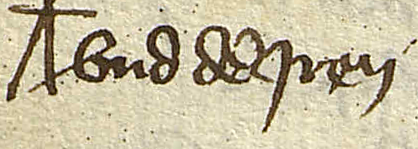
vnd de* Iren
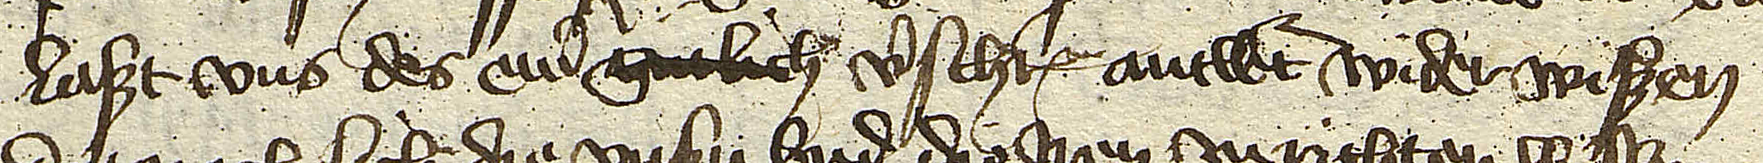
laſʒt vns des ew* gütlich v*ſchr* antwt* wider wiſʒen
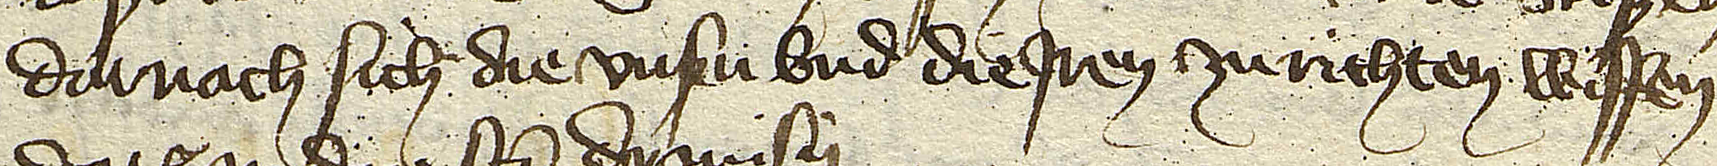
darnach ſich die vnſ*n vnd die Iren cʒu richten wiſſen
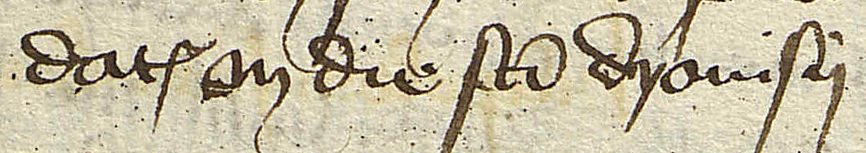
dat* in die ſci* dyoniſi
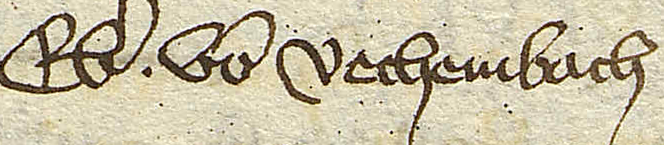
Eb*. vo* vechembach
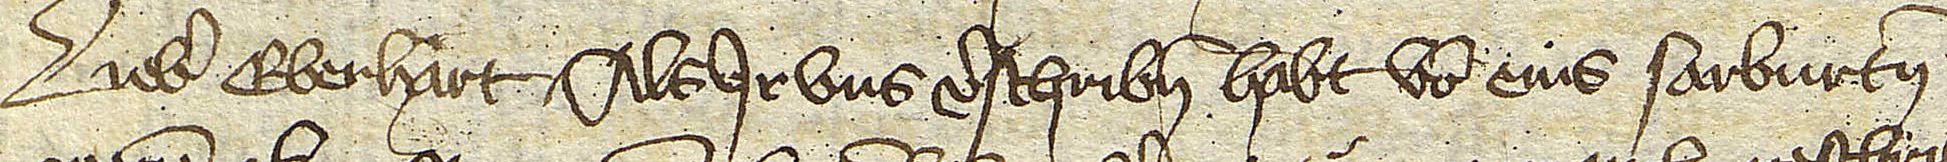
Lieb* Eberhart / Als Ir vns v*ſchribn* habt vo* eins ſarburtn*
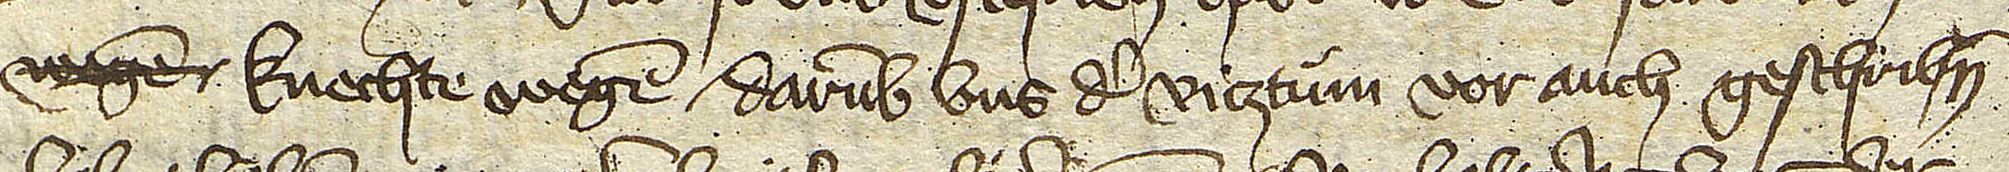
wege* / knechte wege* / darub* vns d* vicʒtum vor auch geſchribn*
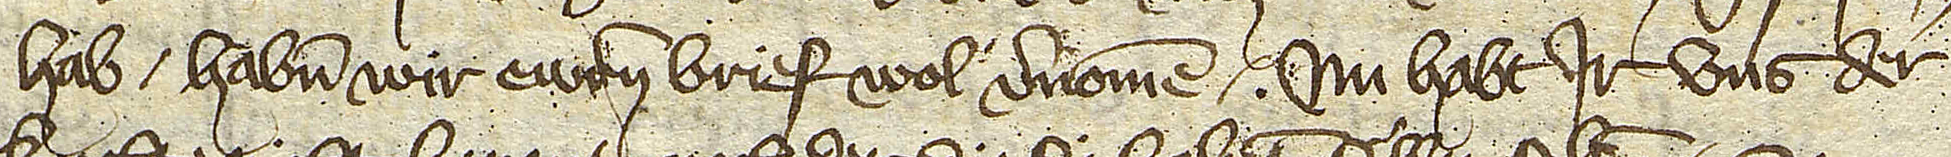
hab / habn* wir ewrn* brief wol v*nome* / . Nu habt Ir vns der
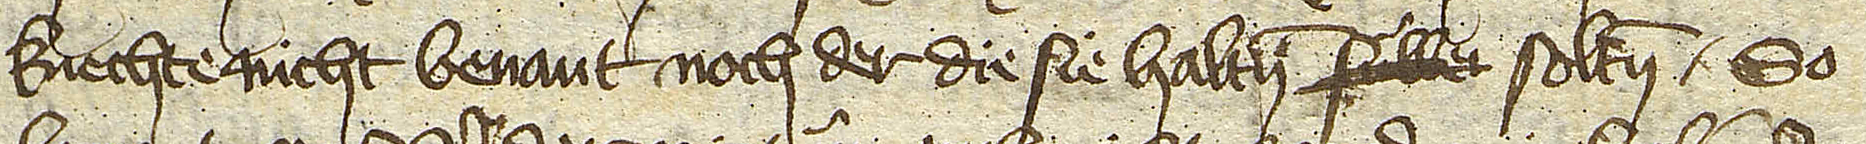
knechte nicht benant noch der die ſie haltn* ſülle ſoltn* / So
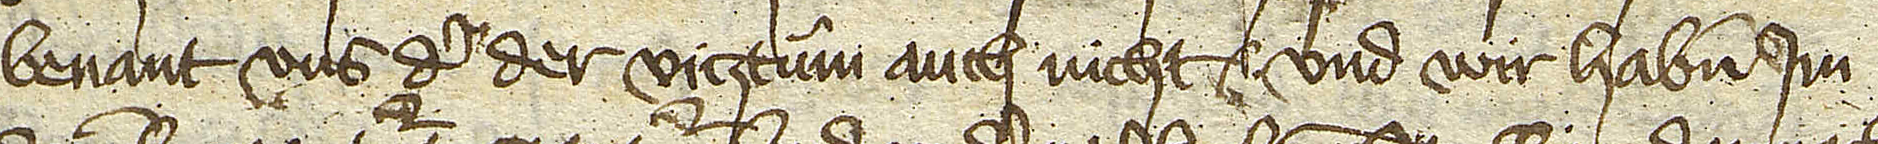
benant vns d* der vicʒtüm auch nicht / . vnd wir habn* Im
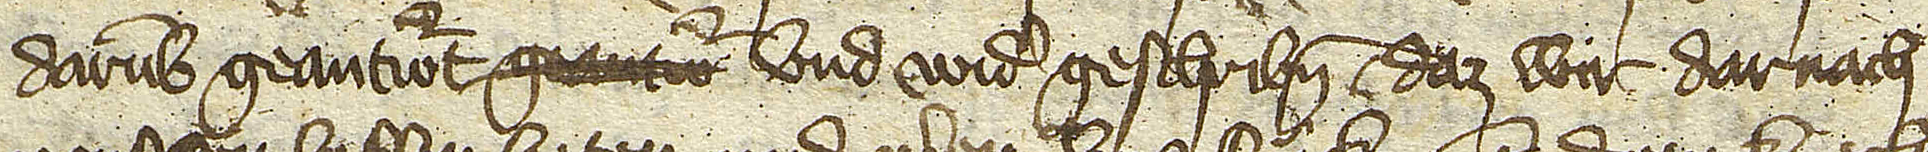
darub* geantwt* geantw* vnd wid* geſchribn* / daʒ wir darnach
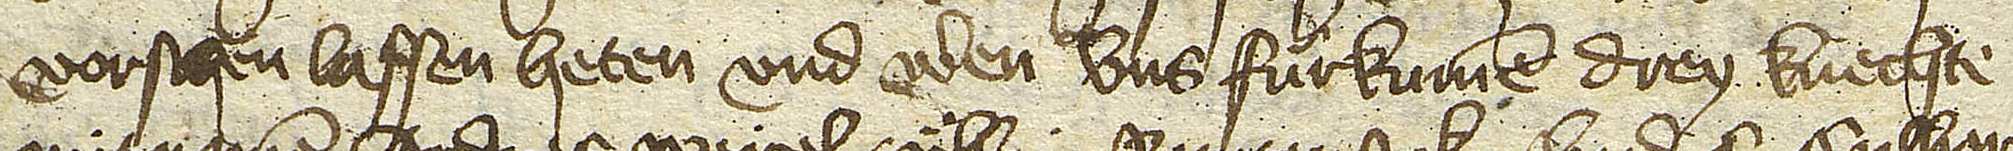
vorſchen laſſen heten vnd w*en vnd fürkume* drey knechte
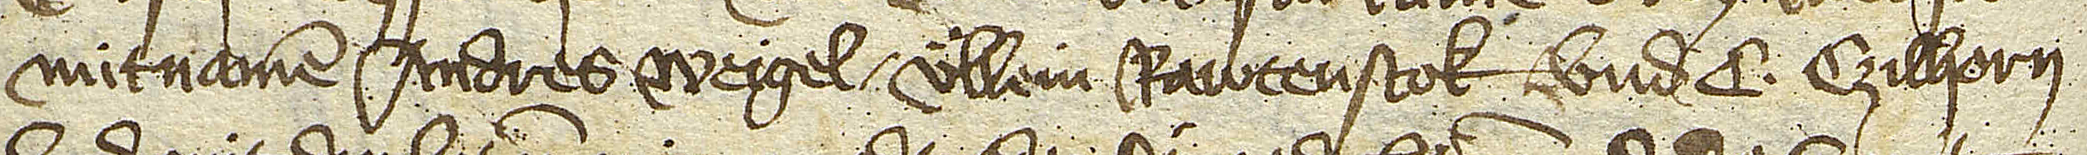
mitname* Andres weigel / v̈llein Rawtenſtok / vnd C . Cʒilhorn
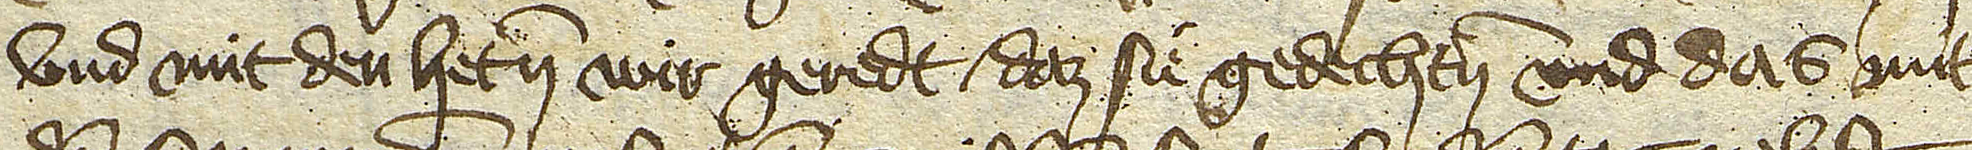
vnd mit den hetn* wir geredt / daʒ ſie gedechtn* vnd das mit
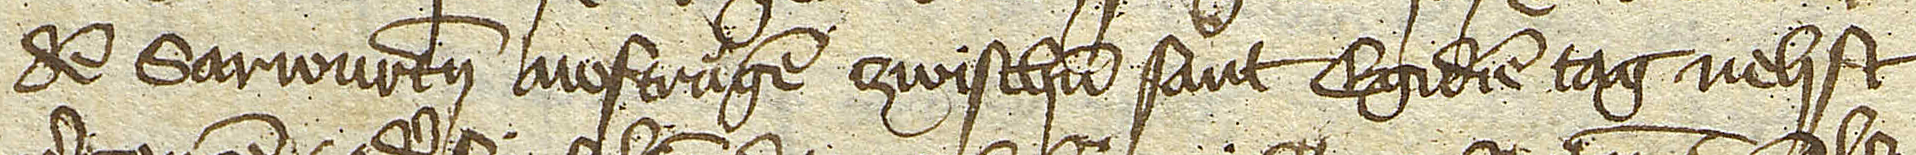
d* Sarwurtn* awſtrüge* cʒwiſchn* ſant Egidie* tag nehſt
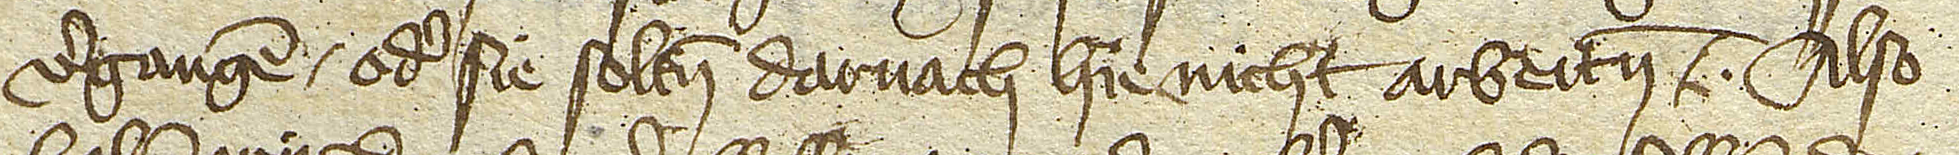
v*gange* / od* ſie ſoltn* darnach hie nicht arbeitn* / . Alſo
